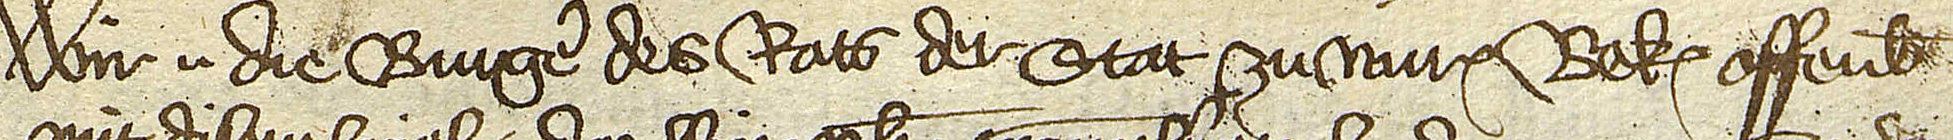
Wir ~ die Burge* des Rats der Stat cʒu Nür* Bek* offenl*
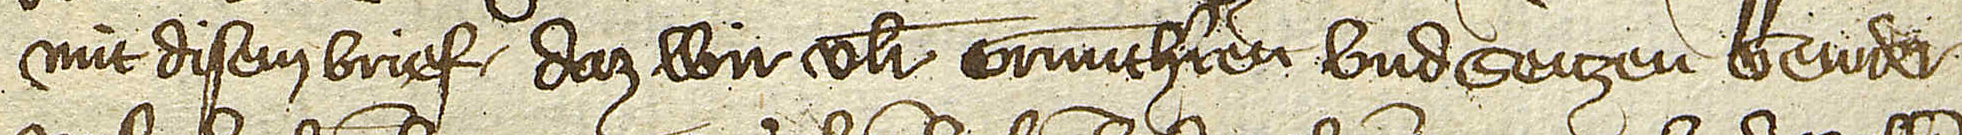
mit diſem brief / daʒ wir vlr* Grunth*ren vnd Seicʒen Gewder
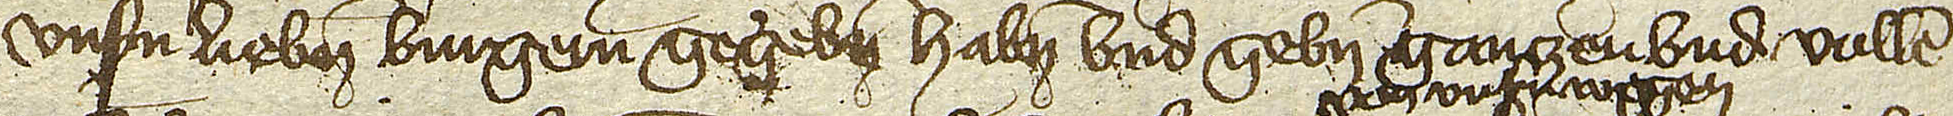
vnſ*n liebn* burgern gegebn* habn* vnd gebn* gancʒen vnd volle*
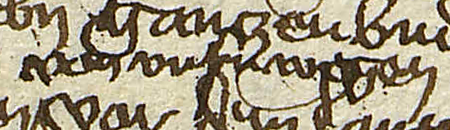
von vnſ*n wegen
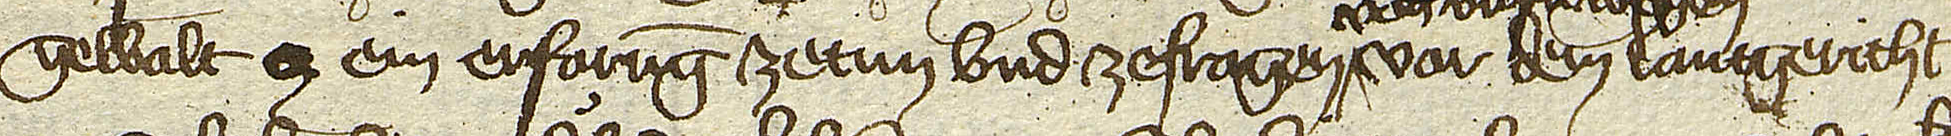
gewalt cʒ ein erfarug* cʒetun vnd cʒefragen vor dem lantgericht
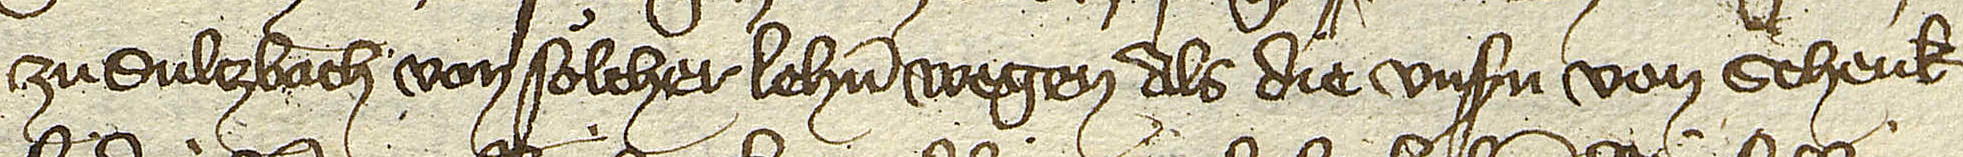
cʒu Sulcʒbach von ſölicher lehn* wegen Als die vnſ*n von Schenk
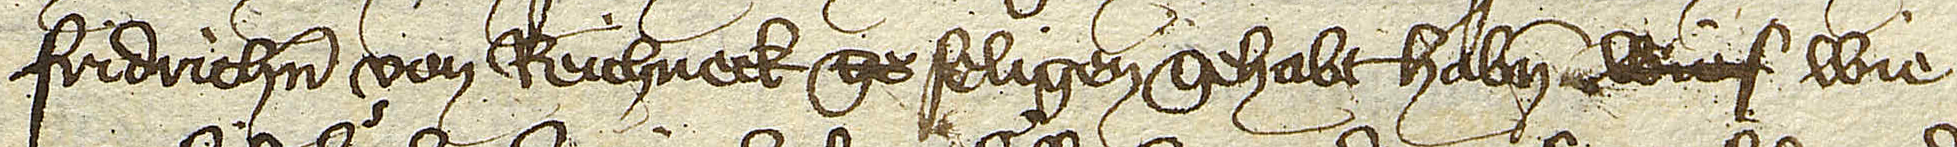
Fridrichn* von Reichneck ge ſeligen gehabt habn* wie ſ wie
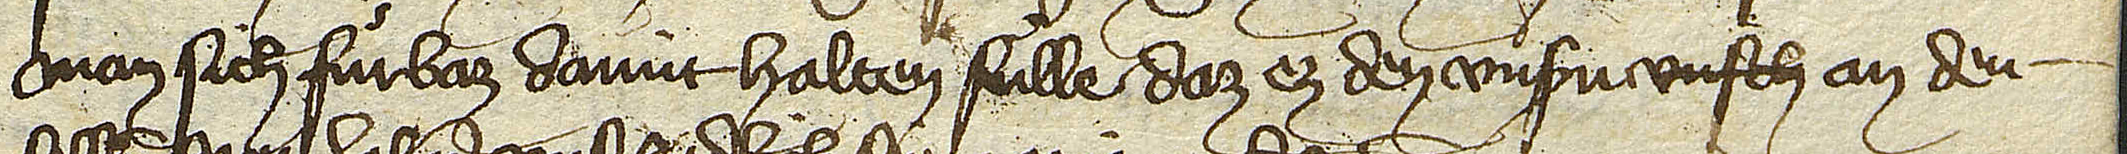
man ſich fürbaʒ damit halten ſülle / daʒ eʒ den vnſ*n vnſch an den -
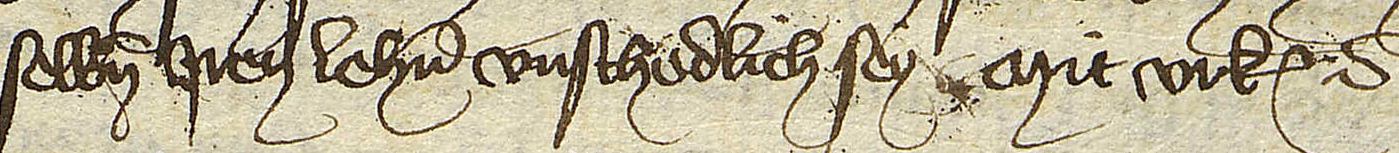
ſelbn* Iren lehn* vnſchedlich ſey / Mit vrk* ec*
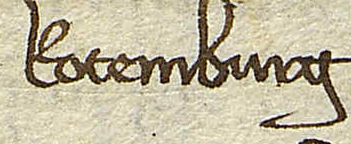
Rotemburg
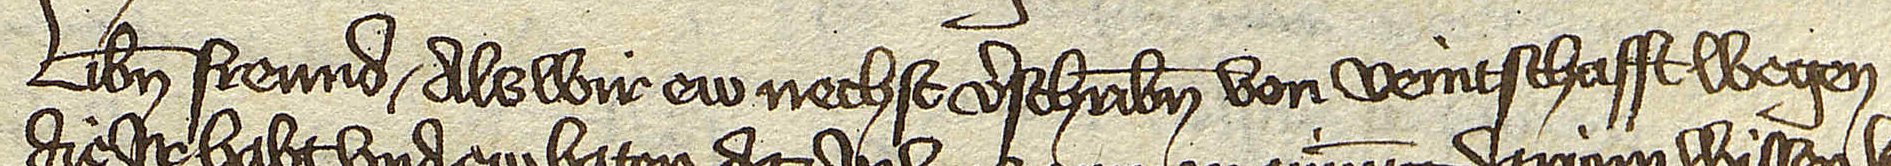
Libn* freund / Als wir ew nechſt v*ſchribn von veintſchafft wegen
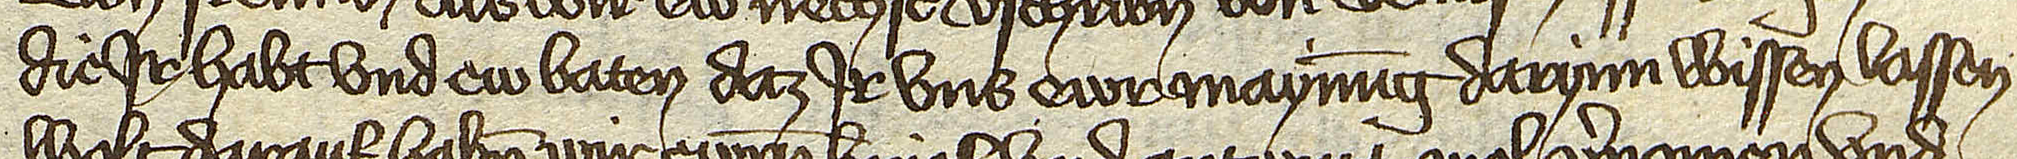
die Ir habt vnd ew baten daʒ Ir vns ewr maynug* darynn wiſſen laſſen
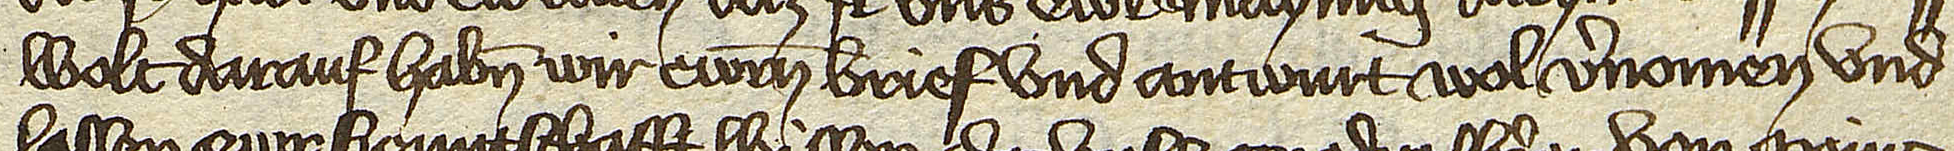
wolt darauf habn* wir ewrn* brief vnd antwurt wol v*nomen vnd
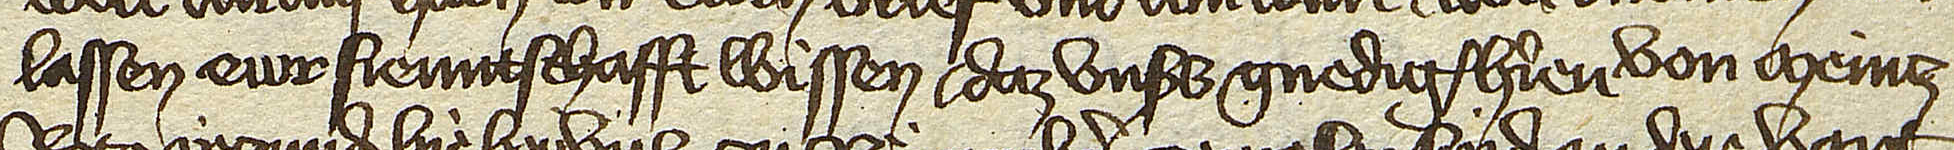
laſſen ewr freuntſchafft wiſſen / daʒ vnſ*s gnedig* h*ren von Meincʒ
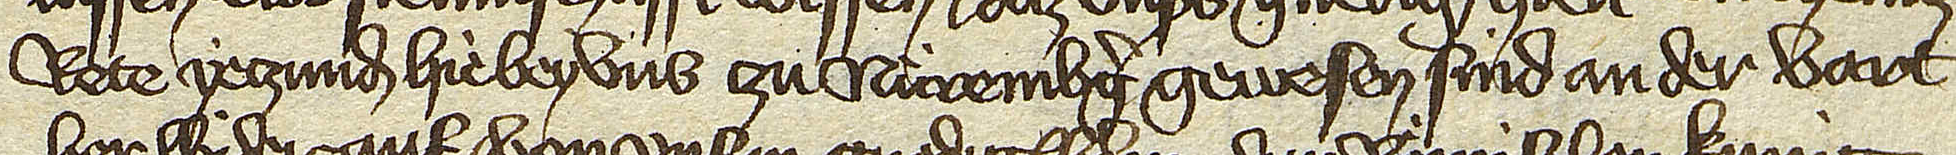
Rete yecʒund* hie bey vns cʒu Nürembg* geweſen ſind an der vart
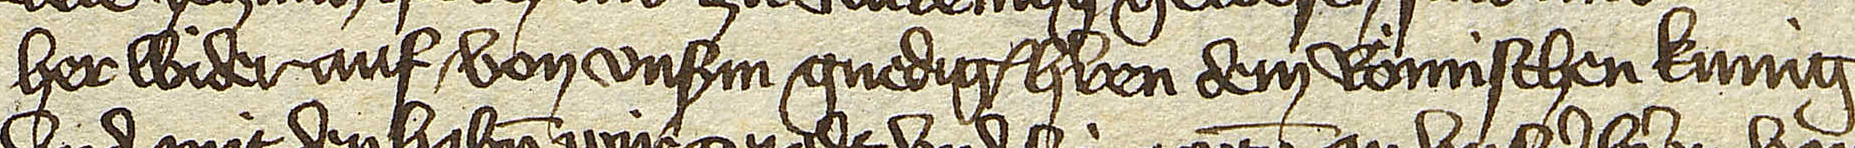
her wider auf / von vnſ*m gnedig* h*ren dem Römiſchen kunig
